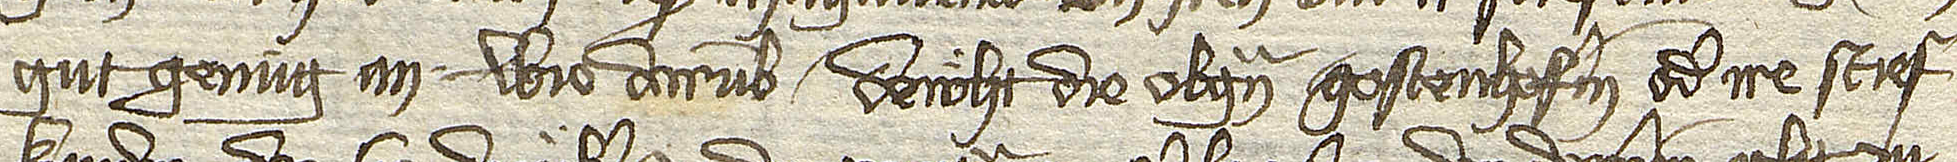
gut genüg an . Wie darub* / Deẅht die obgn* goſtenhof*in od* ire ſtief
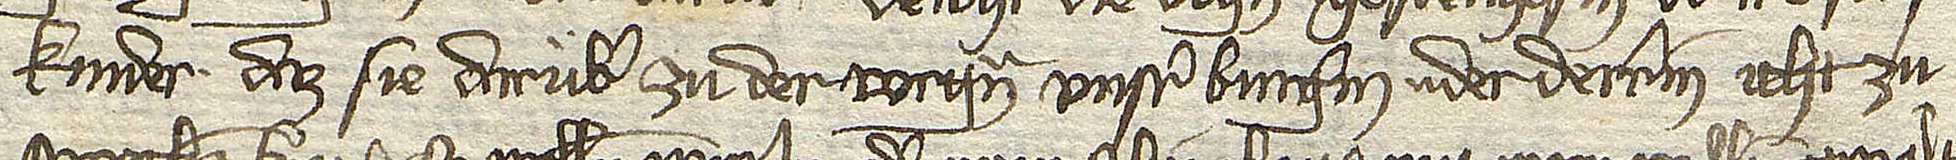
kinder . daʒ ſie darüb* ʒu der vorgn* vnſr* burg*in ~ der derr*in icht ʒu
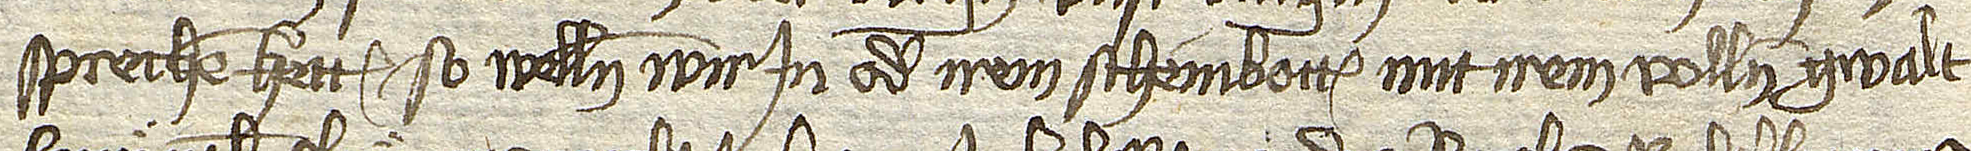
ſpreche* hett* / ſo welln* wir In od* irem ſcheinbott* mit irem volln* gwalt
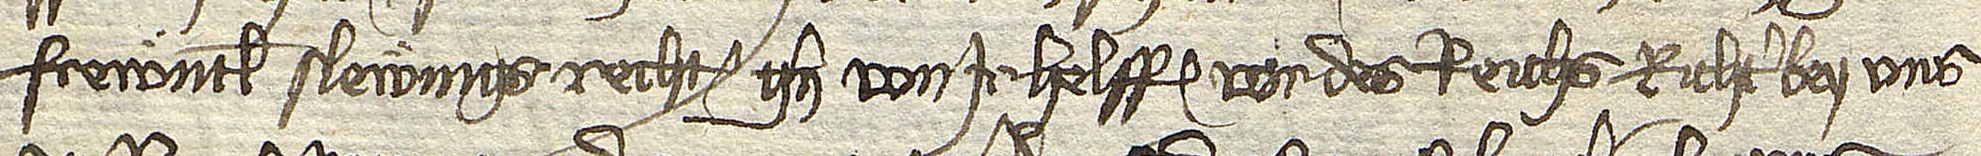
freẅntl* ſleẅnigs recht* g*n von Ir helff* vor des Reichs Richt* bey vns
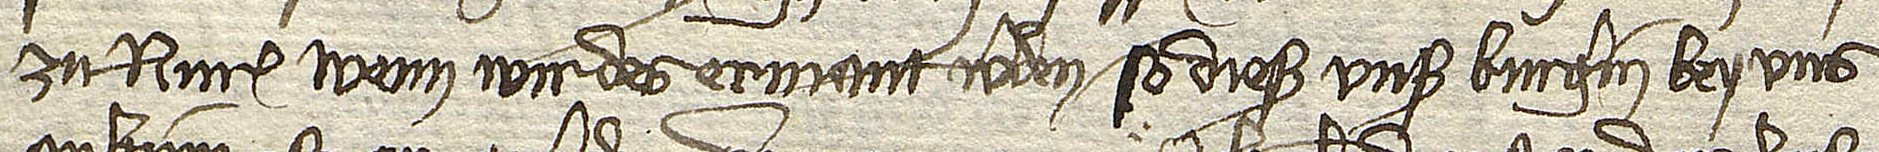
ʒu Nur* wenn wir des ermant w*den / ſo dieſ* vnſ* burg*in bey vns
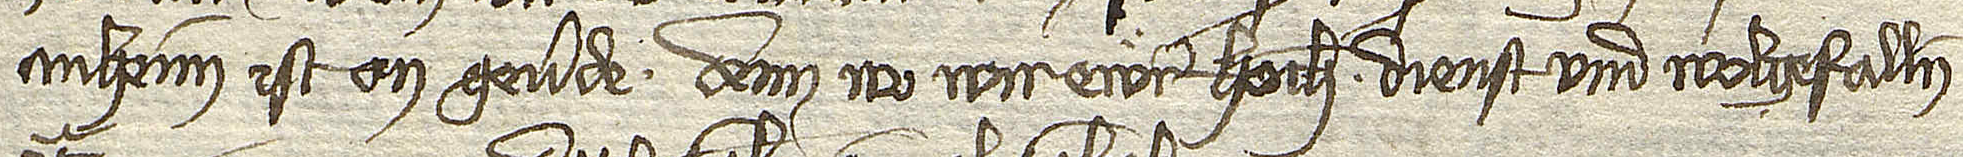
anheim iſt on geu*de . Denn wo wir eẅr* hoch* . dienſt vnd wolgefalln*
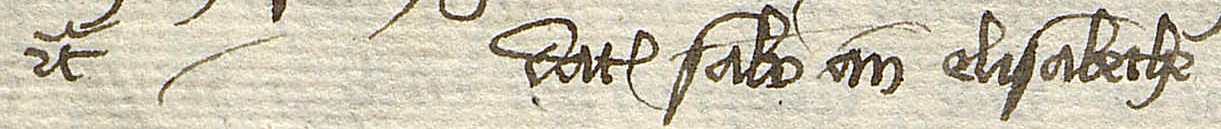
ec* / Dat* ſabo* an* eliſabethe
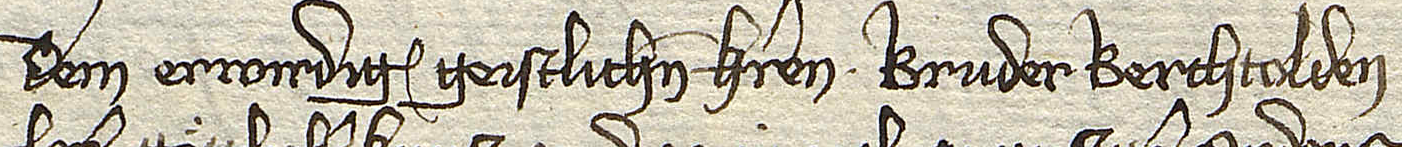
Dem erwirdig* geiſtlichn* h*ren . Bruder Berchtolden
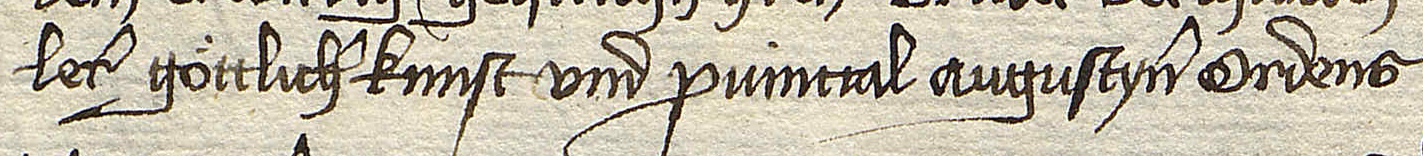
ler* göttlich* kunſt vnd p*uincial auguſtyn* Ordens
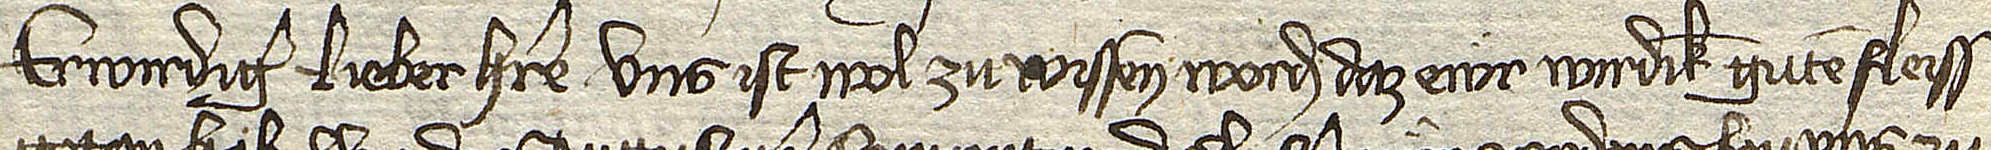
Erwirdig* lieber h*re / Vns iſt wol ʒu wiſſen word* daʒ eẅr wirdik* gute* fleiſſ
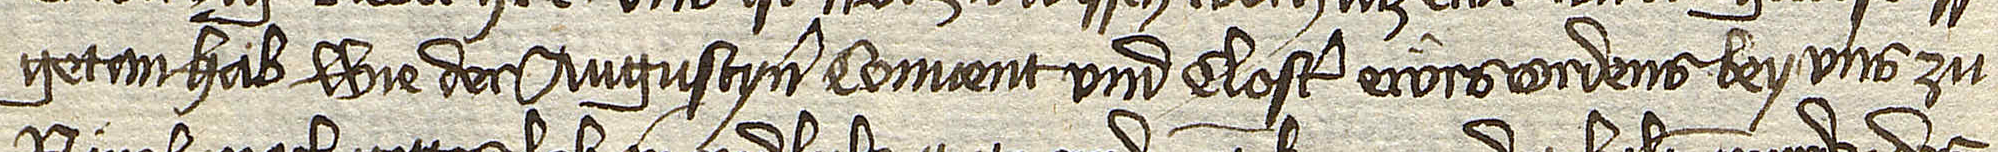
getan hab wie der Augſtyn* Conuent vnd Cloſt* eẅrs Ordens bey vns ʒu
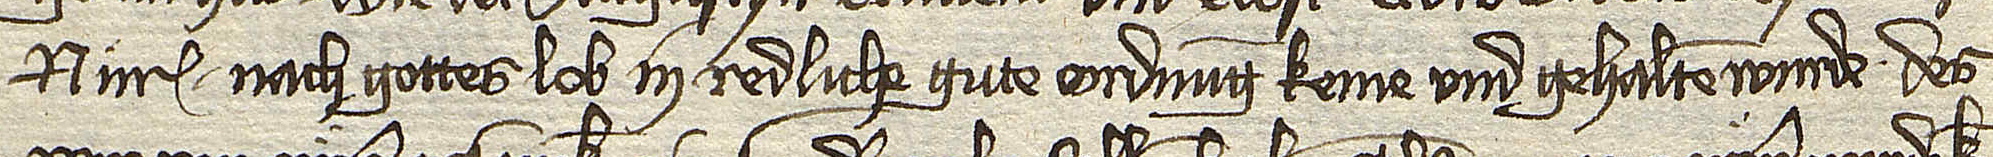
Nür* / nach gottes lob in redliche gute Ordnu*g keme vnd gehalte* wurde . Des
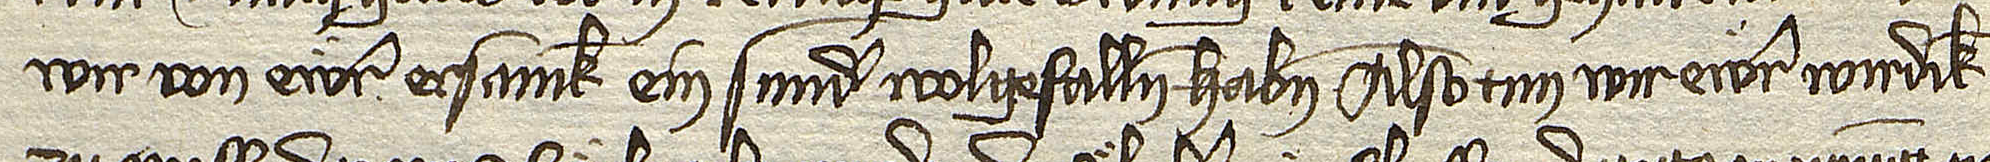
wir von eẅr* erſamk* ein ſund* wolgefalln* habn* Alſo tun wir eẅr* wirdik*
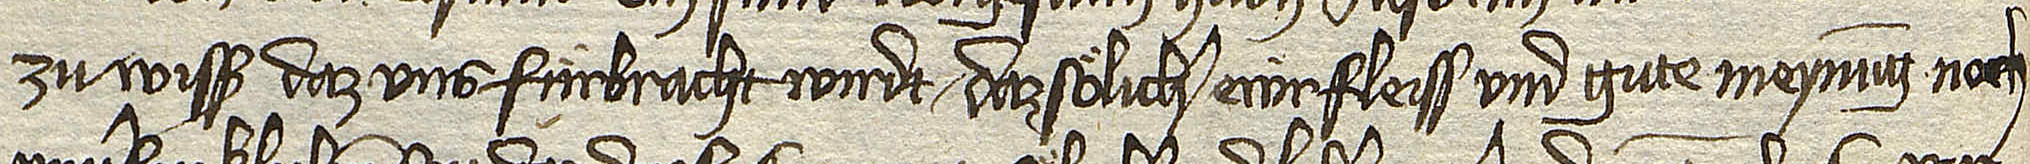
ʒu wiſſ* daʒ vns fürbracht wirdt / Daʒ ſölich* eẅr fleiſſ vnd gute meynu*g noch
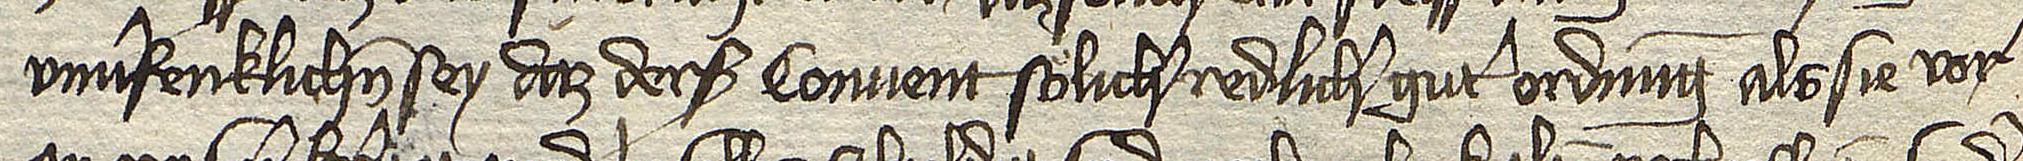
vnu*fenklichn* ſey daʒ derſ* Conuent ſölich* redlich* gut* ordnu*g als ſie vor
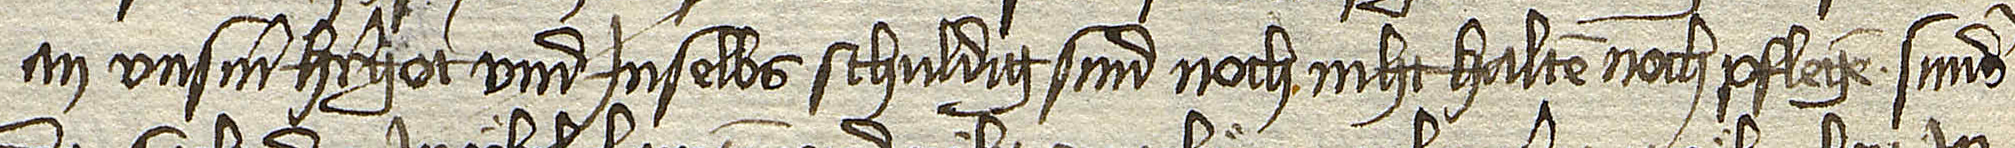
an vnſm* hr*got vnd Inſelbs ſchuldig ſind noch niht halte* noch pflege* . ſund*
